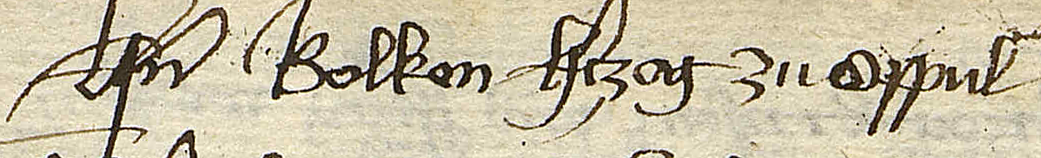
Hn* Bolken h*cʒog ʒu Oppul
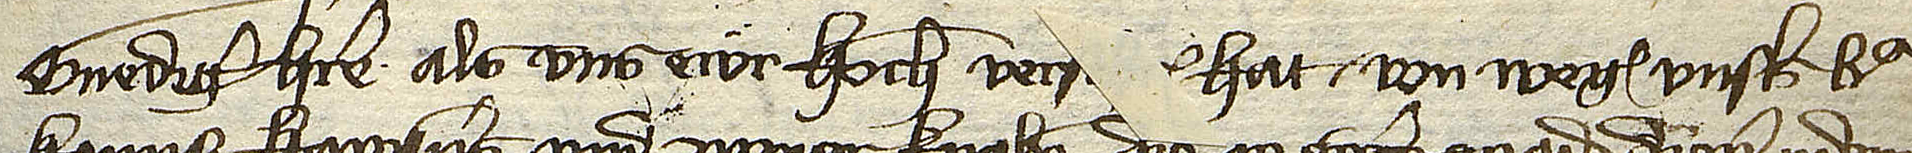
Gnedig* hr*e als vns ewr Hoch* verſchr* hat / von weg* vnſ*s b*
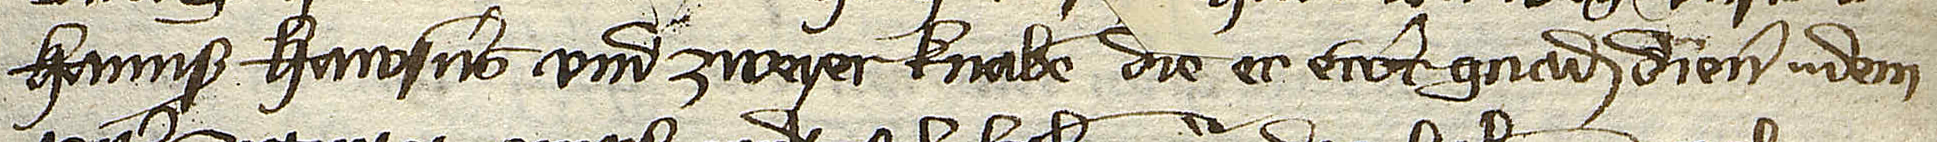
hannſ* hawſn*s vnd ʒweyer knabe* die er ew*r gnad* dien* ~ dem
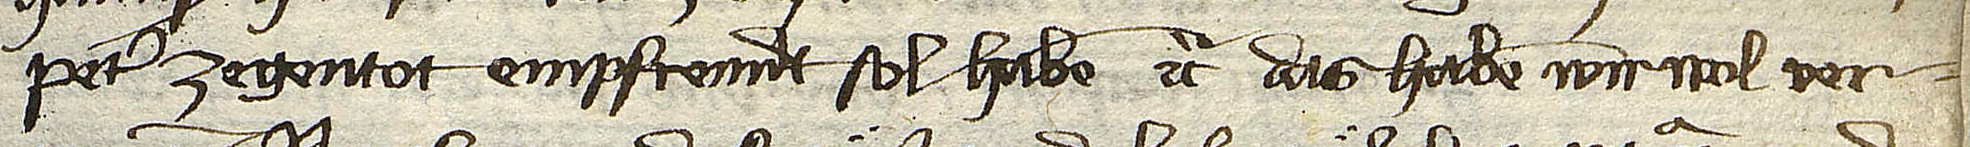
Pet* Ʒegentot empfremdt ſol habe* ec* das habe* wir wol ver =
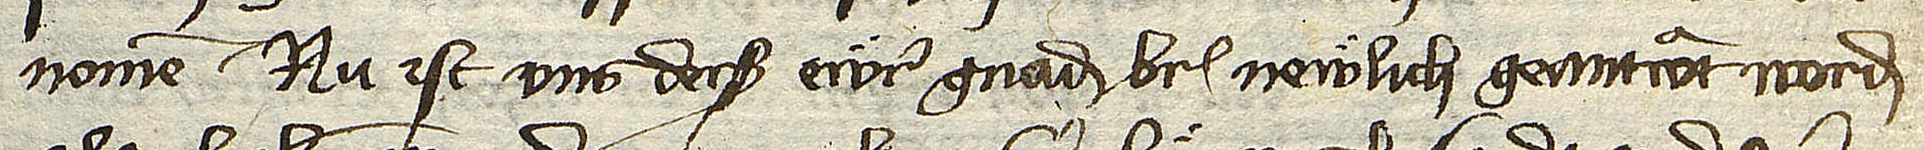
nome* / Nu iſt vns derſ* ewr* gnad* br* newlich geantw*t word*
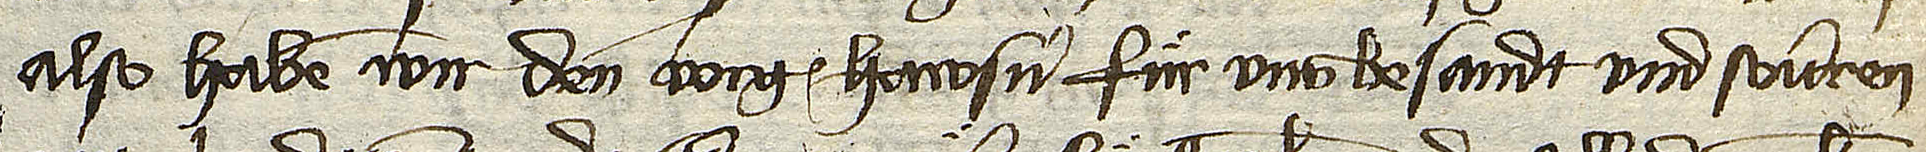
alſo habe* wir den vorg* hawſn* für vns beſant vnd ſou*ren
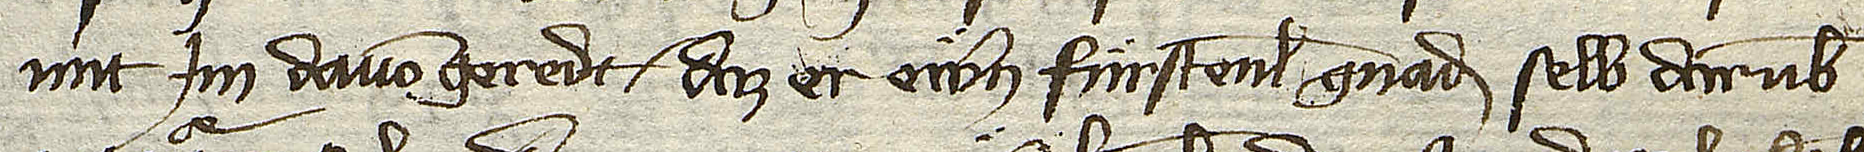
mit Im dauo* geredt / daʒ er ew*n fürſtenl* gnad* ſelb darub*
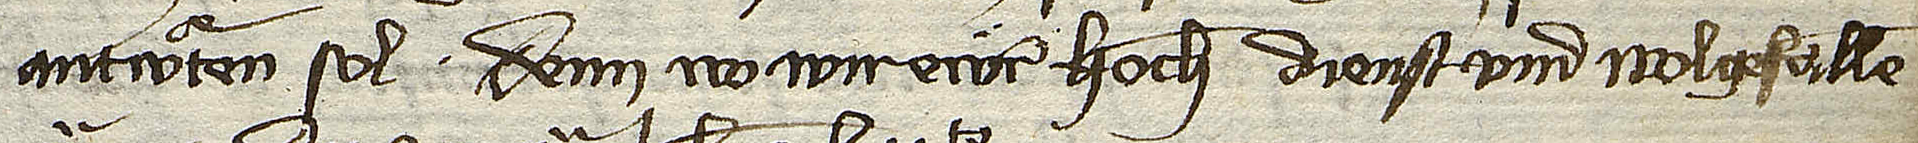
antw*ten ſol . Denn wo wir ewr* hoch* dienſt vnd wolgefalle*
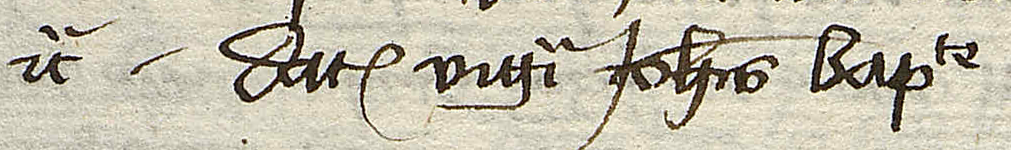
ec* / Dat* vigi* Iohis* bap*
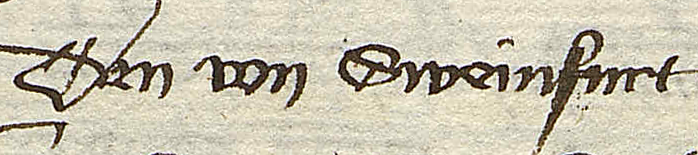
Den von Sweinfurt
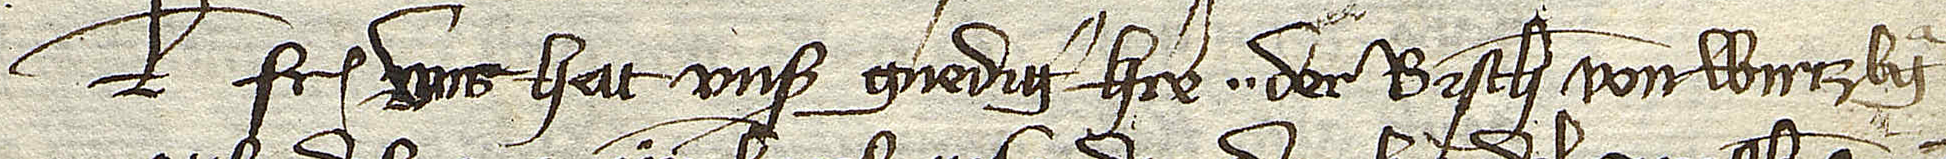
L* fr* Vns hat vnſ* gnedig* hr*e ~ der Biſch* von Wircʒbg*
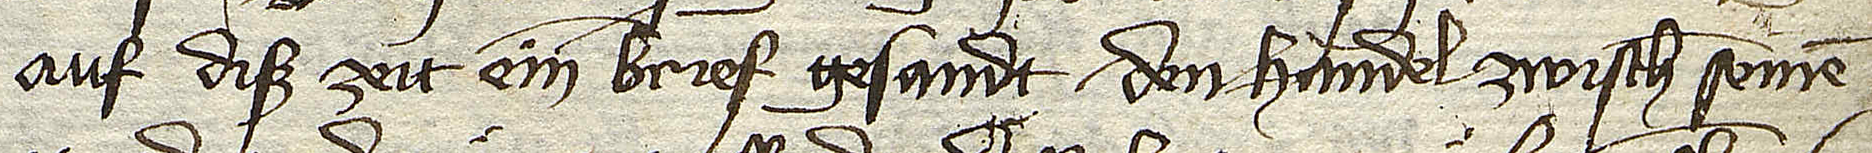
auf diſʒ ʒeit ein* brief geſandt / den handel ʒwiſch* ſeine*
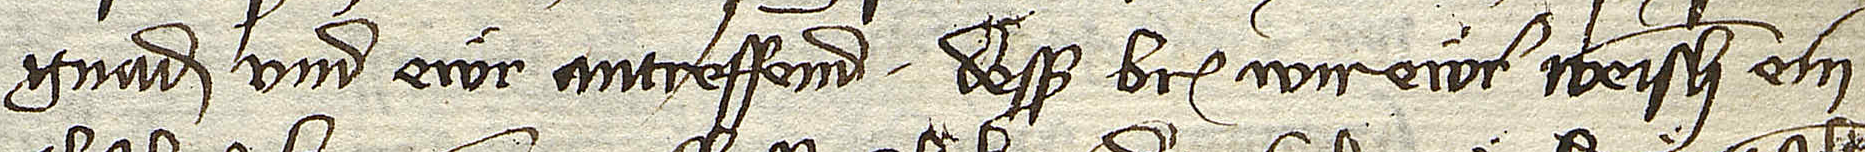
gnad* vnd ewr antreffend / deſſ* br* wir ewr* weiſh* ein
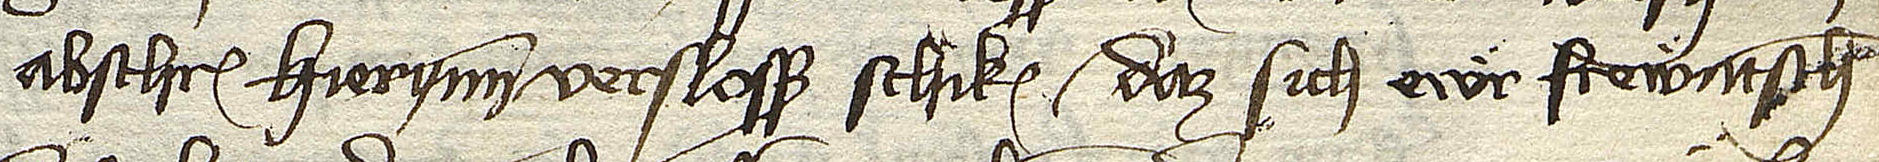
abſchr* hierynn* verſloſſ* ſchik* / daʒ ſich ewr frewntſch*
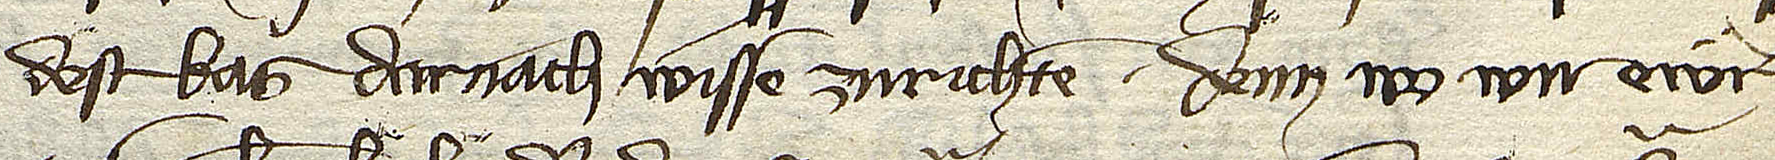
deſt bas darnach wiſſe ʒurichte* / Denn wo wir ewr*
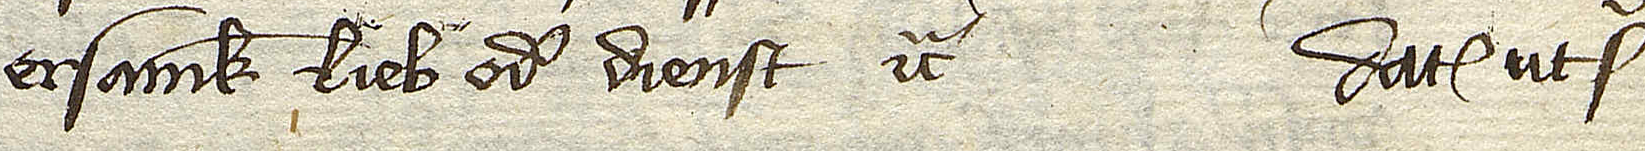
erſamk* lieb od* dienſt ec* Dat* ut ſ*
